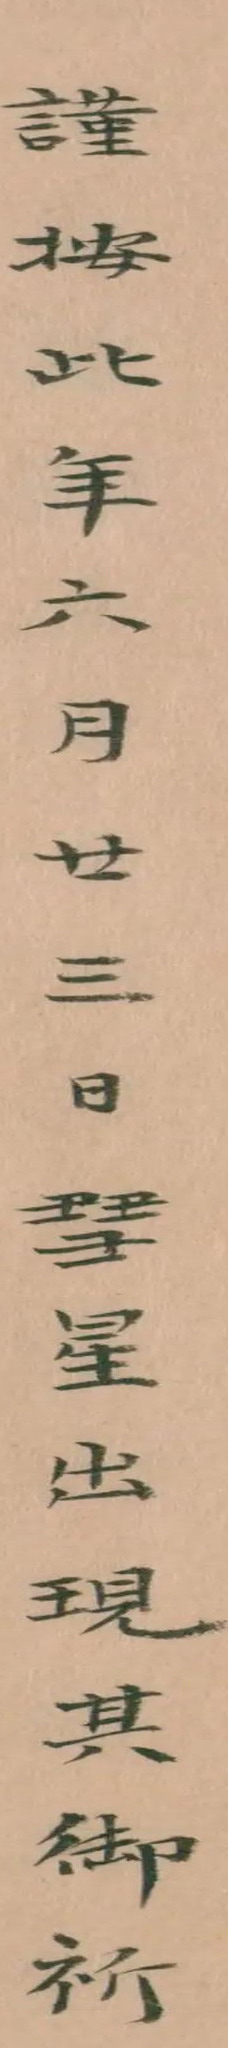謹按此年六月廿三日彗星出現其御祈
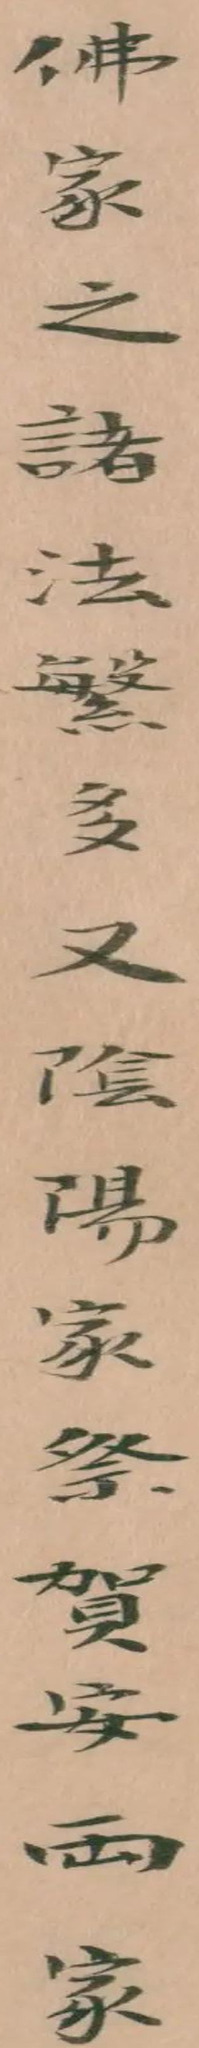仏家之諸法繁多又陰陽家祭賀安両家
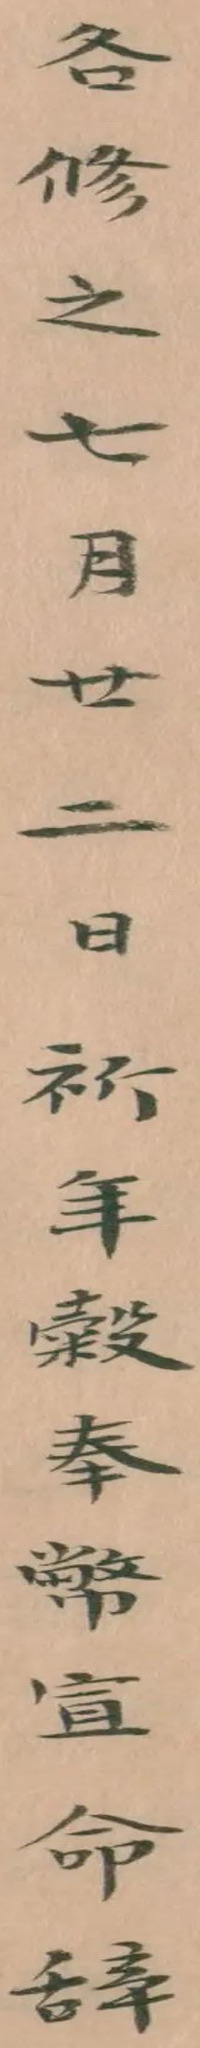各修之七月廿二日祈年穀奉幣宣命辞
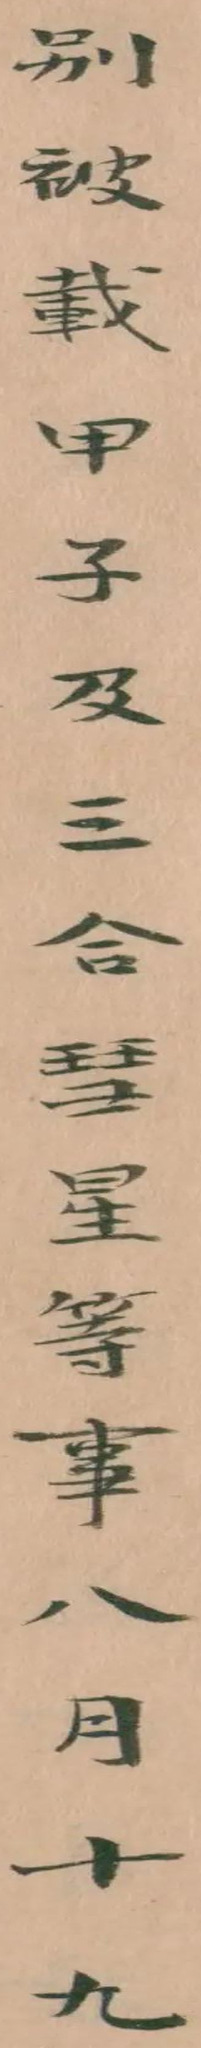別被戴甲子及三合彗星等事八月十九
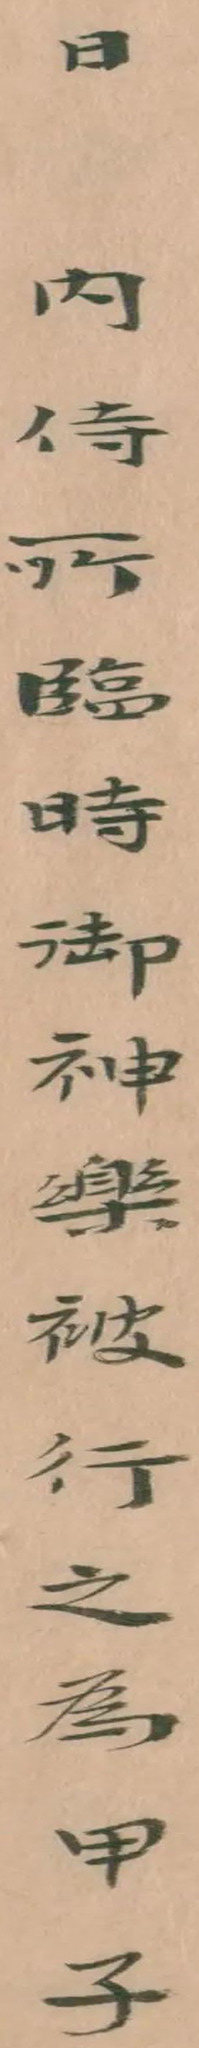日内侍所臨時御神楽被行之為甲子

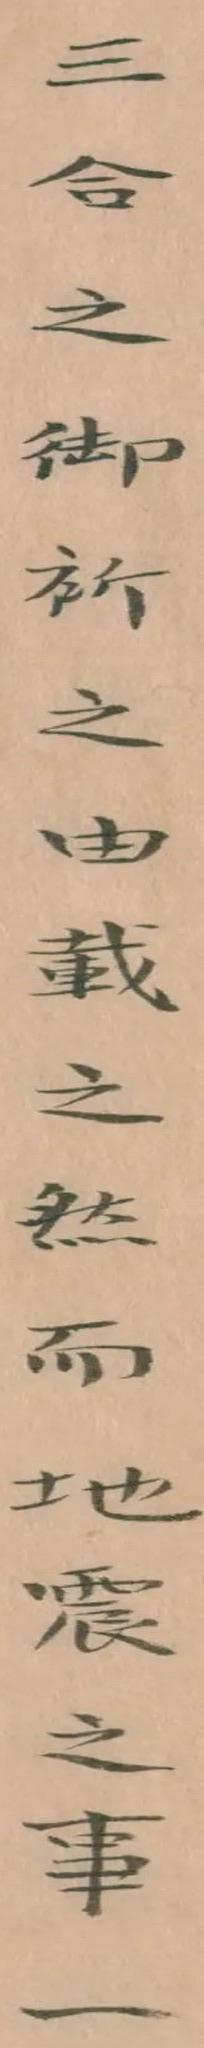三合之御祈之由戴之然而地震之事一
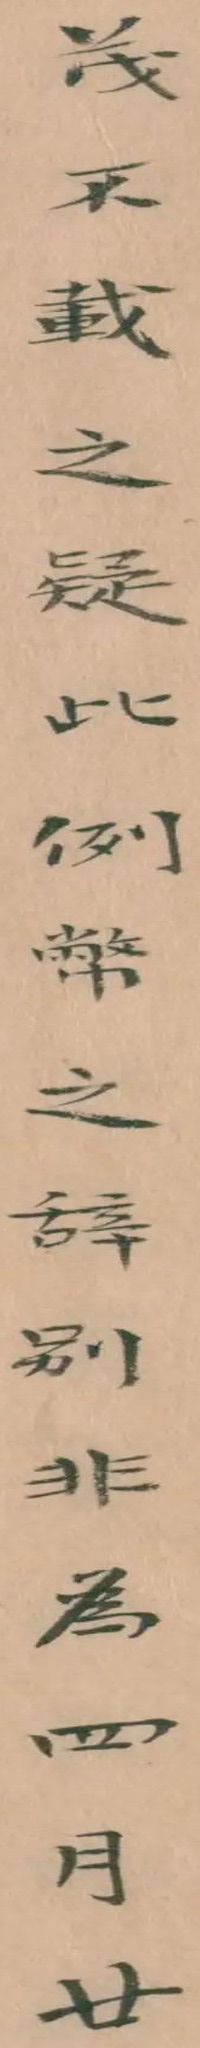茂不戴之疑比例幣之辞別非為四月廿
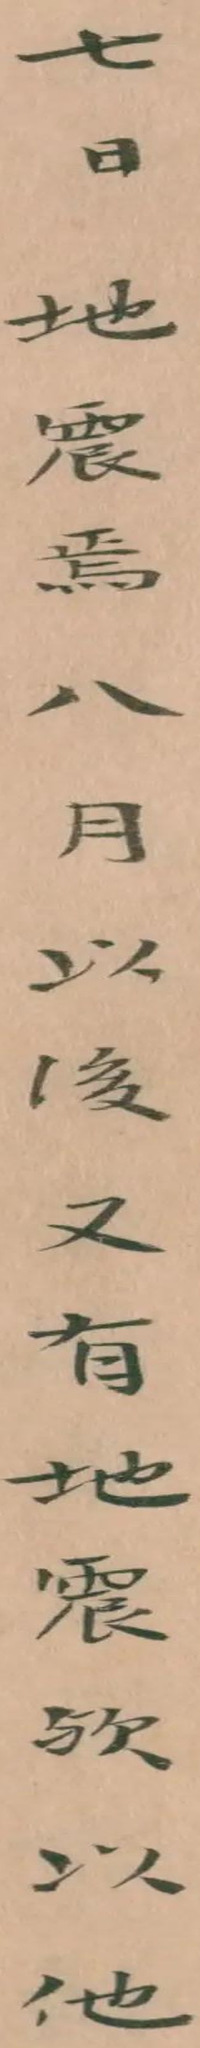七日地震焉八月以後又有地震歟以他
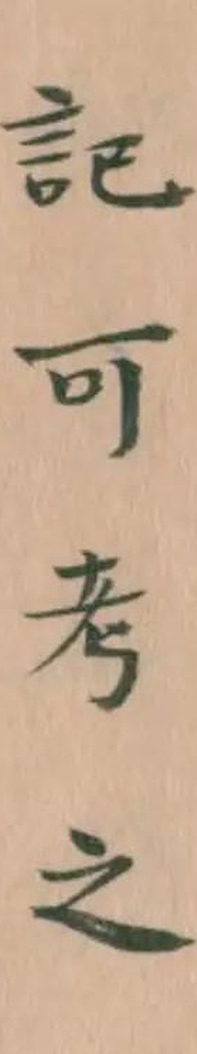記可考之
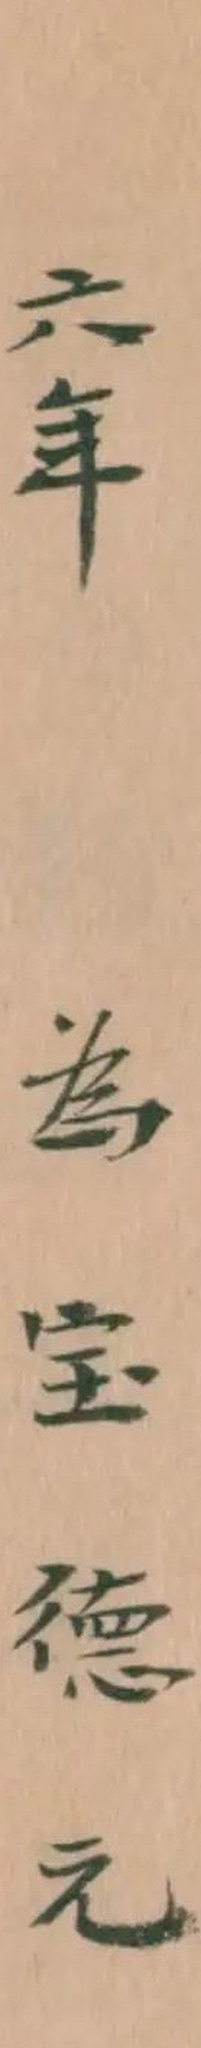同六年為宝徳元
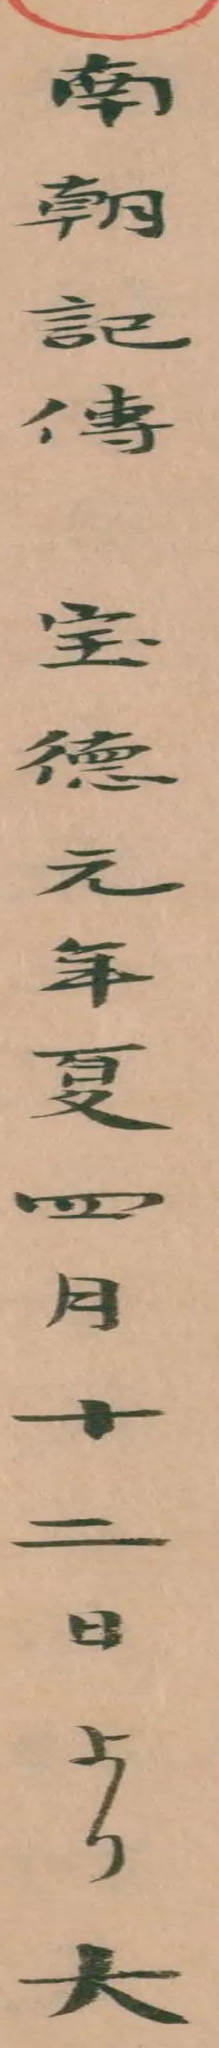○南朝記伝宝徳元年夏四月十二日より大
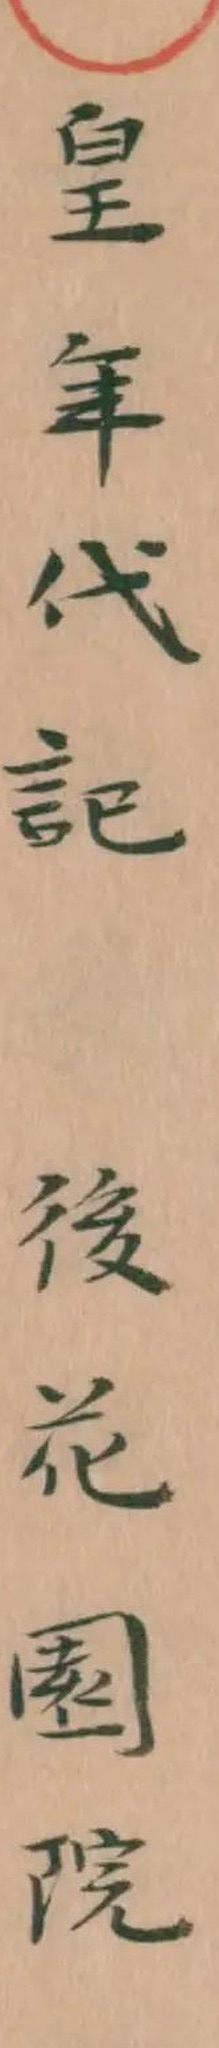○皇年代記後花園院
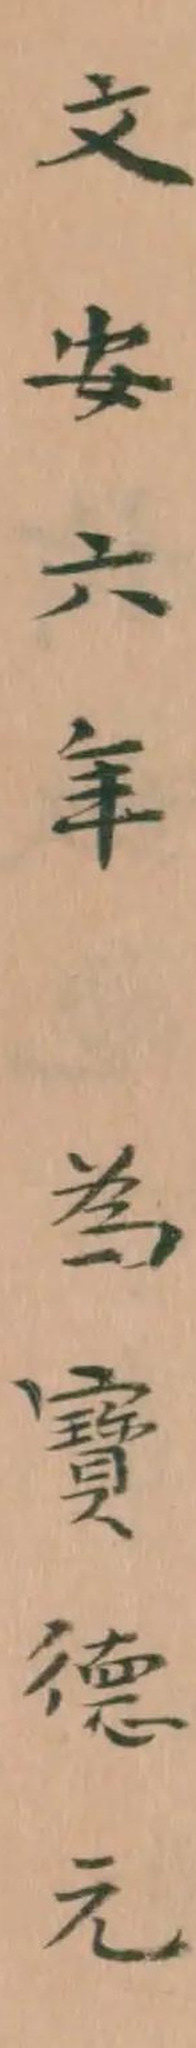文安六年為宝徳元
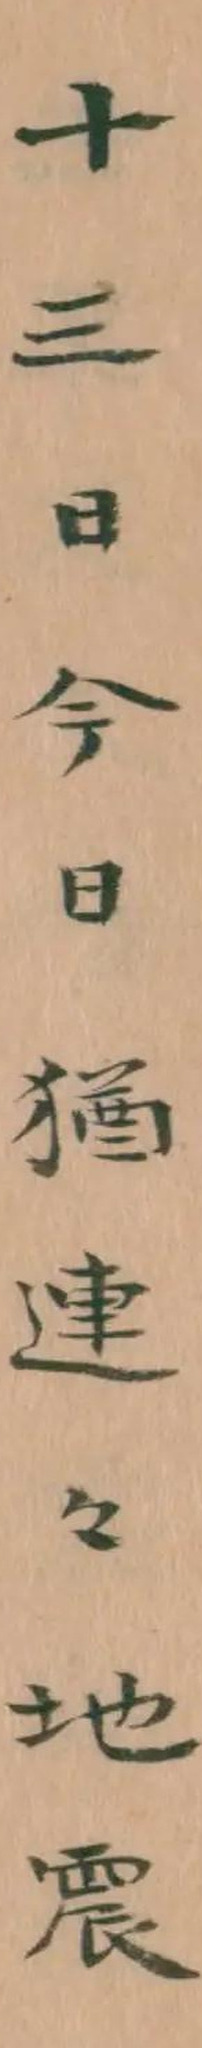十三日今日猶連々地震
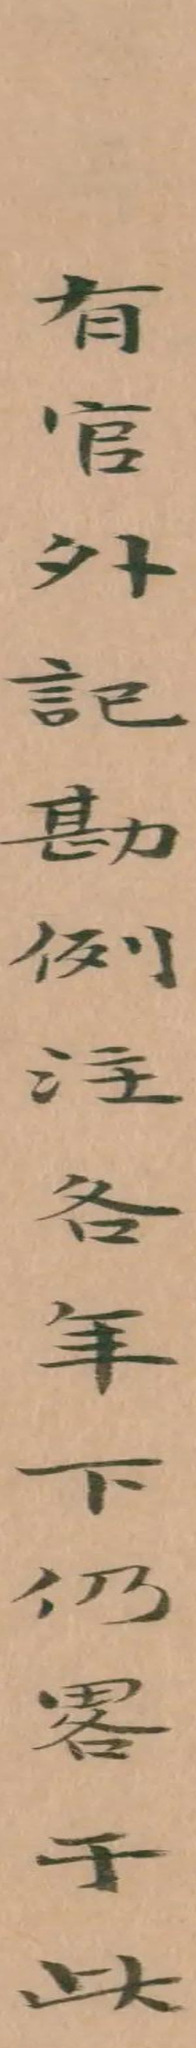有官外記勘例注各年下仍略荷于此
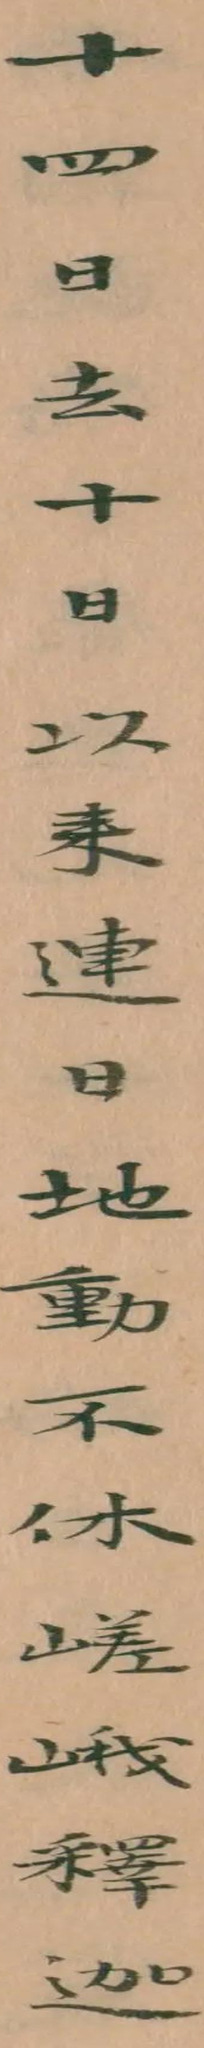十四日去十日以来連日地動不休嵯峨釈迦
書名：地災撮要. 巻5-6(地震之部)
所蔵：国立国会図書館 National Diet Library, JAPAN
